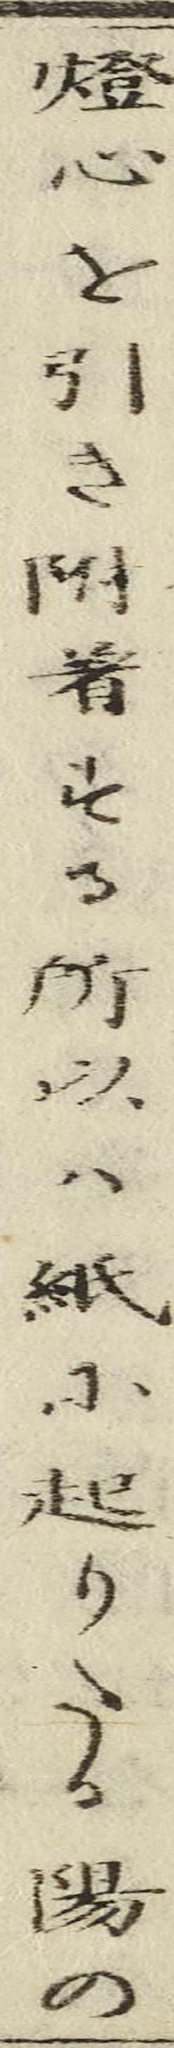灯心を引き附着する所以は紙に起りたる陽の
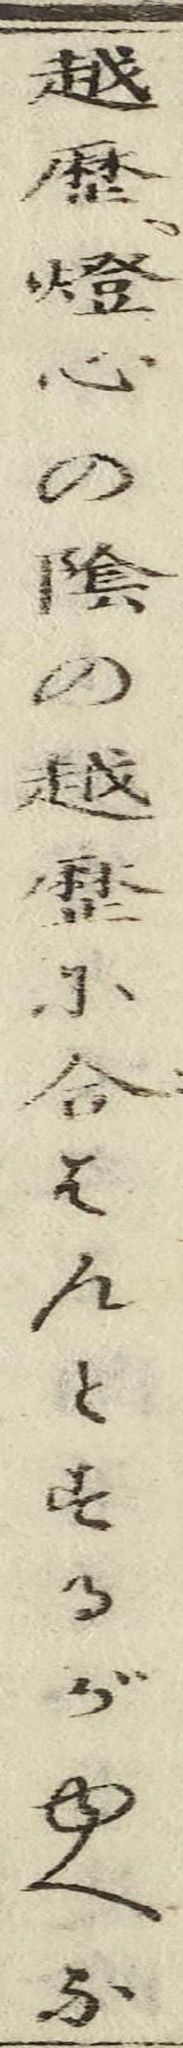越歴。灯心の陰の越歴に合はんとするがゆへな
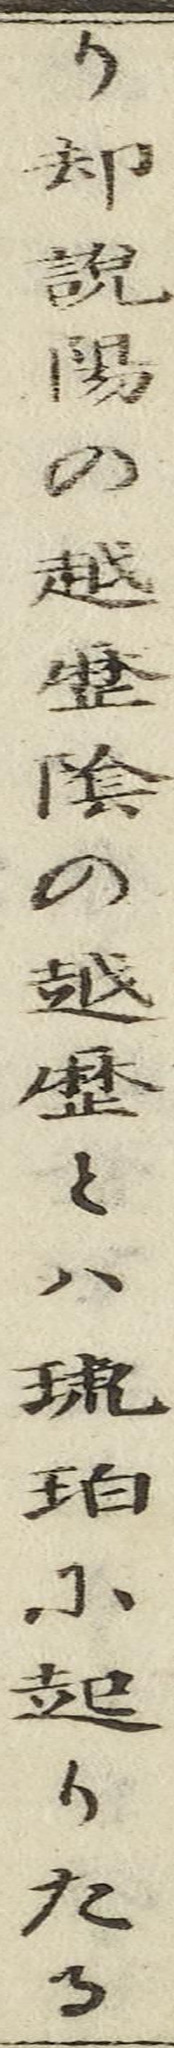り却説陽の越歴陰の越歴とは琥珀に起りたる
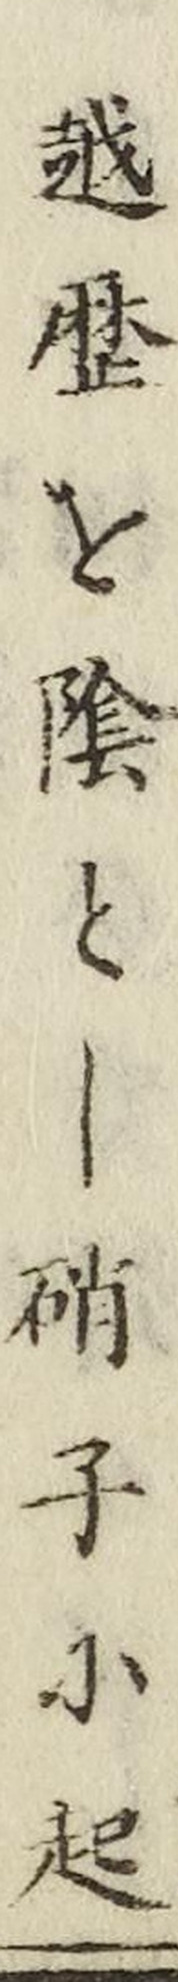越歴を陰とし硝子に起
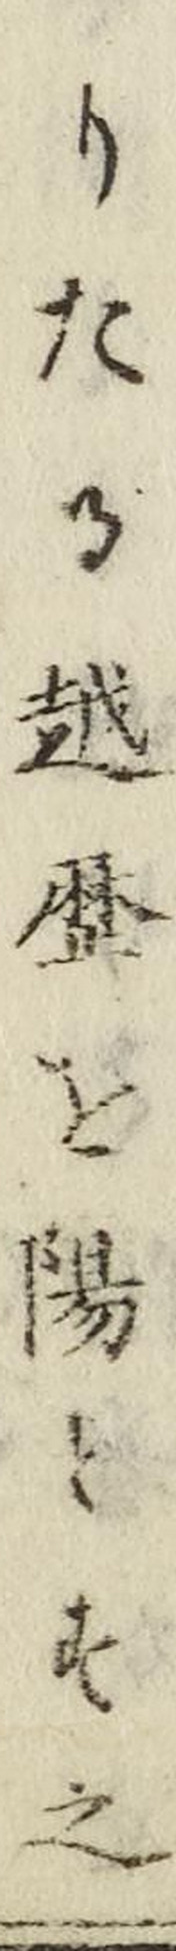りたる越歴を陽とす之
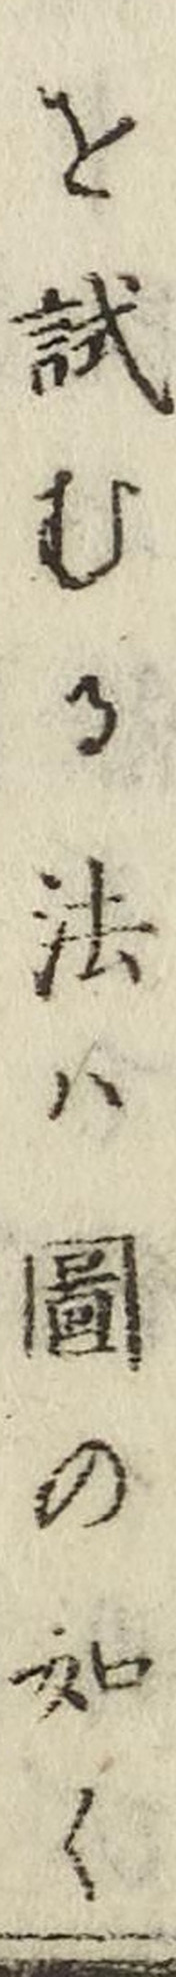を試むる法は図の如く
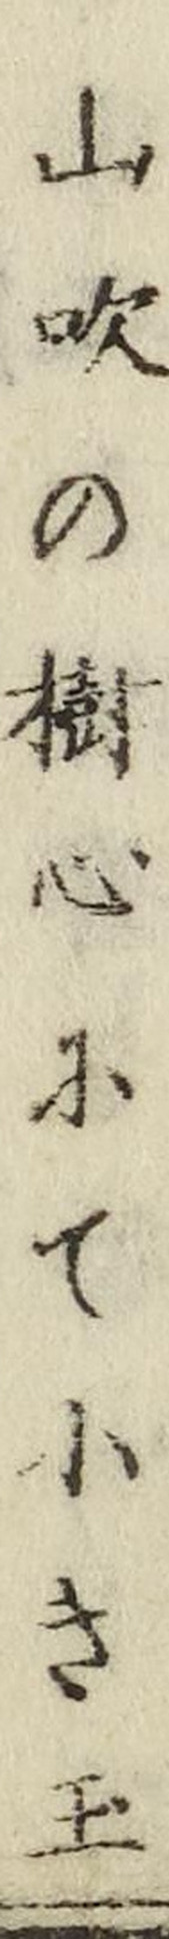山吹の樹心にて小き玉
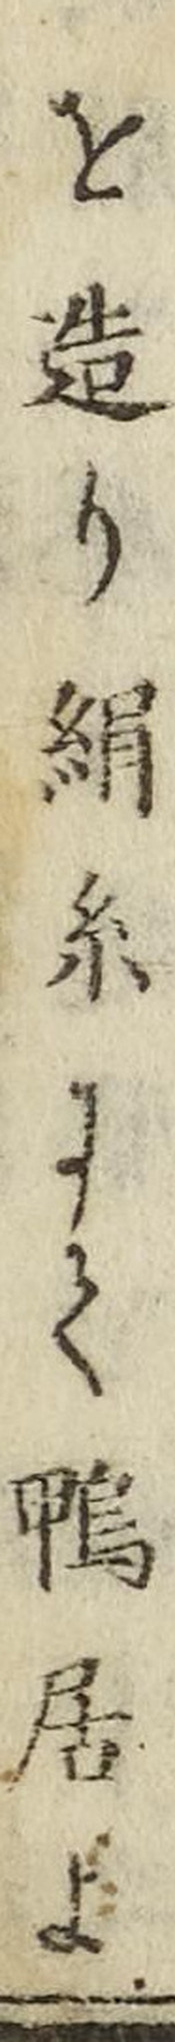を造り絹糸にて鴨居よ

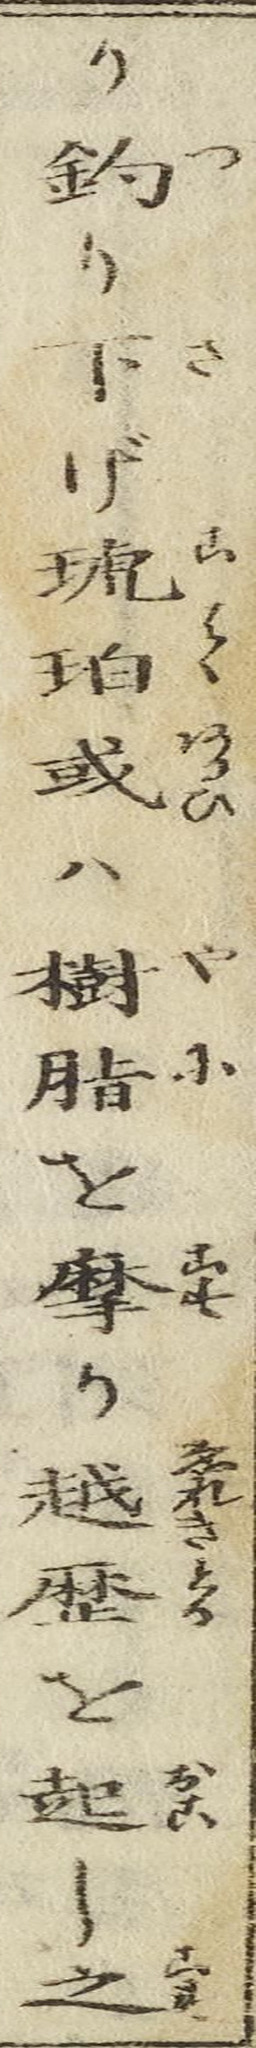り釣り下げ琥珀或は樹脂を摩り越歴を起し之
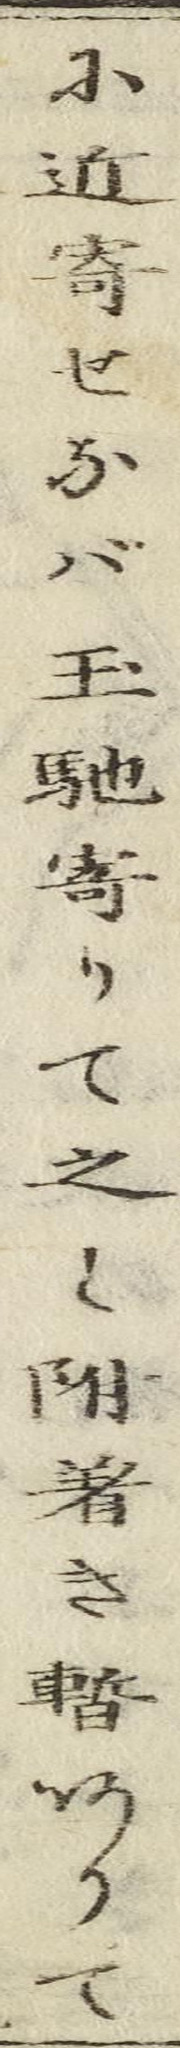に近寄せなば玉馳寄りて之と附着き暫ありて
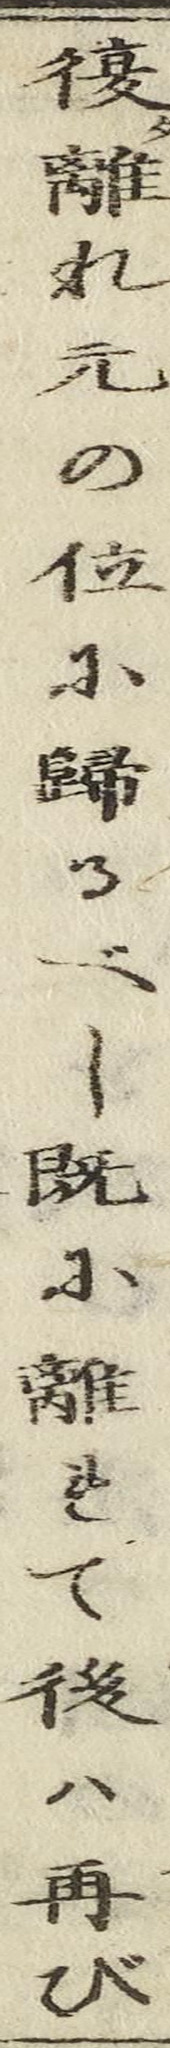復タ離れ元の位に帰るべし既に離れて後は再び
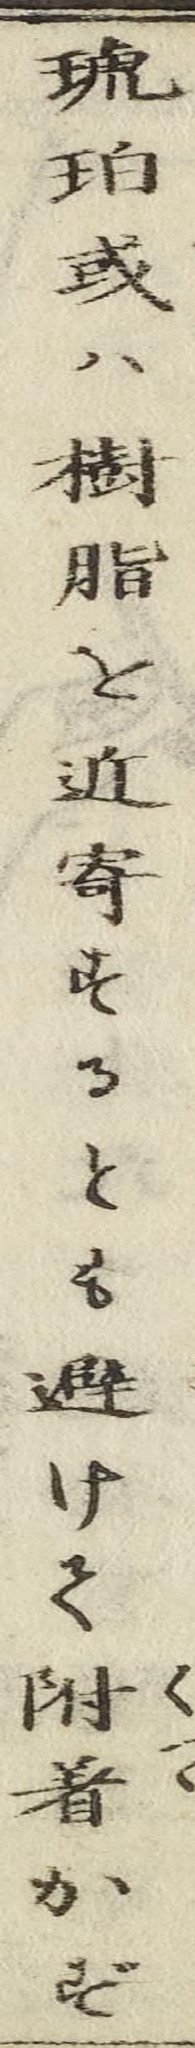琥珀或は樹脂を近寄するとも避けて附着かず
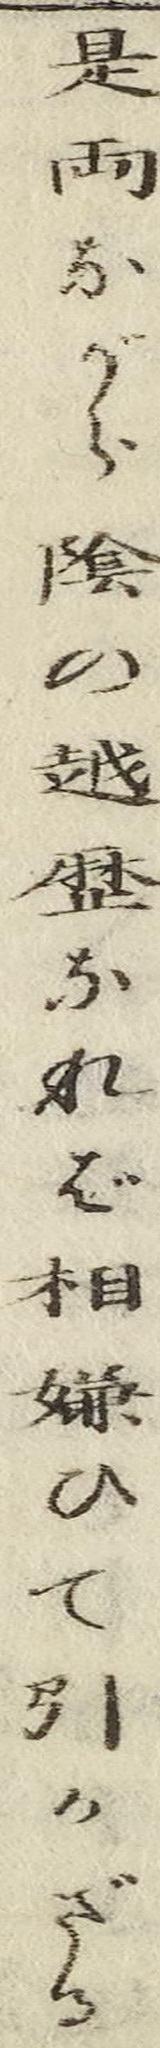是両ながら陰の越歴なれば相嫌ひて引かざる
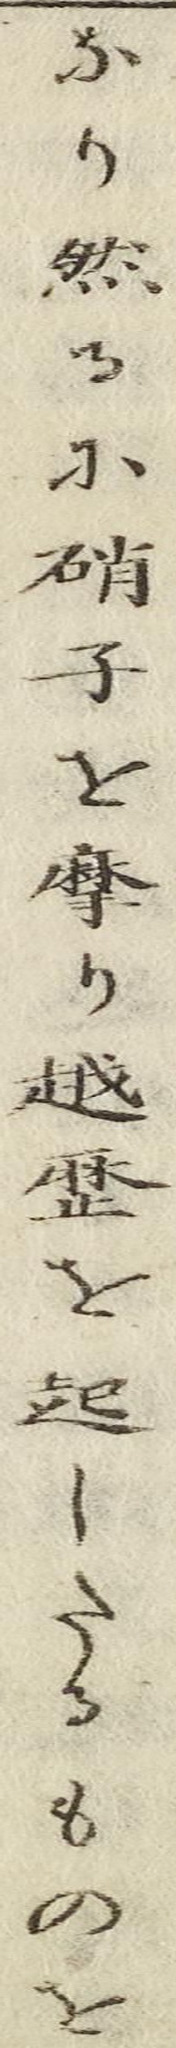なり然るに硝子を摩り越歴を起したるものを
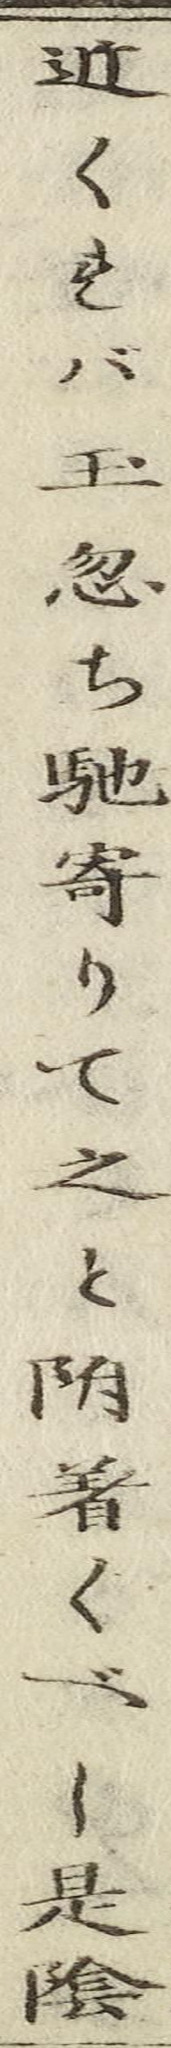近くれば玉忽ち馳寄りて之と附着べし是陰
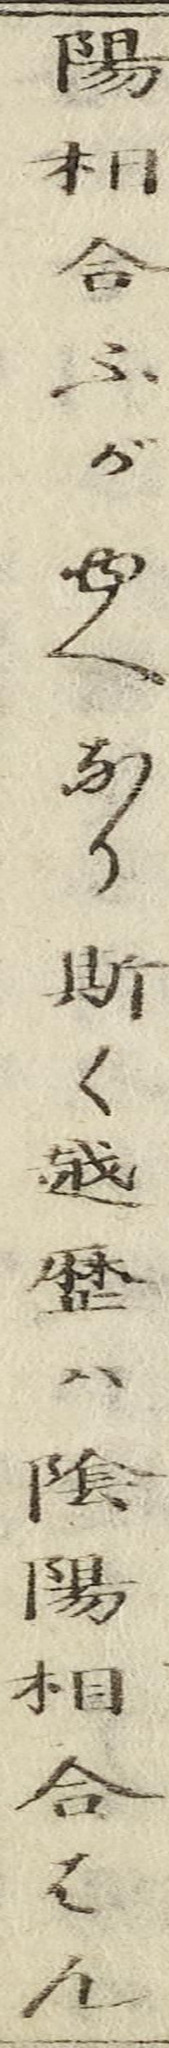陽相合ふがゆへなり斯く越歴は陰陽相合はん
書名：天変地異
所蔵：東京大学地震研究所図書室 Earthquake Research Institute Library, The University of Tokyo, JAPAN
